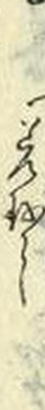差越之
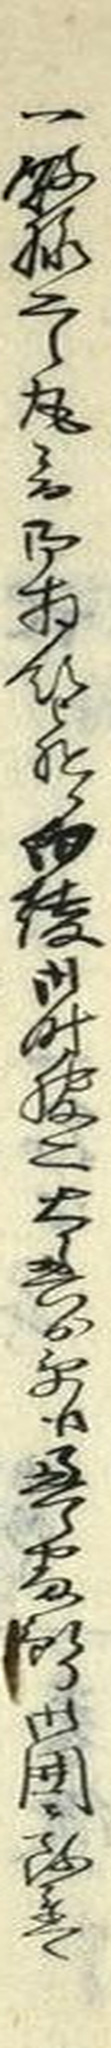一殿様二之丸ニ而御拝領被遊候白綾御時服二大奥ゟ受取奥之番預り御囲ニ致置候
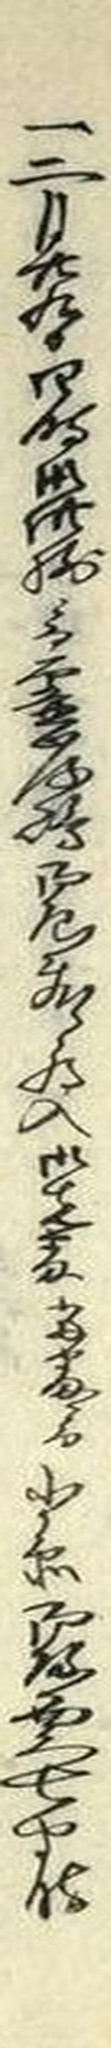一二月廿九日四時御供揃ニ而霊岸嶋御屋敷へ被為入御先番当番ニ而小兵衛御帰殿七半時
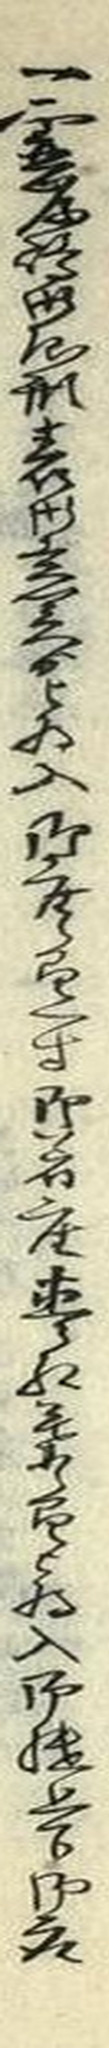一霊岸嶋御屋形表御玄関ゟ被為入御座之間へ一寸御着座直ニ紅葉之間へ被為入御継上下御取
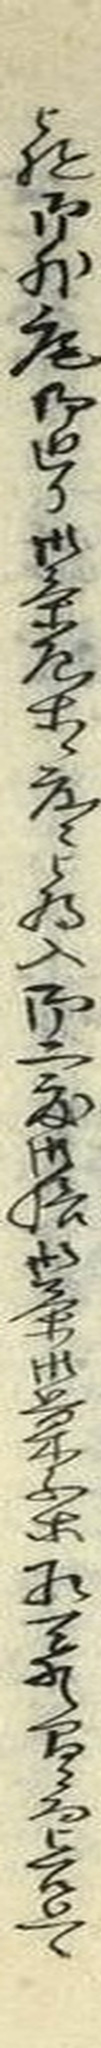被遊御外庭御廻り御茶屋等へ度々被為入御二度御膳御茶御菓子等紅葉之間ニ而被召上候

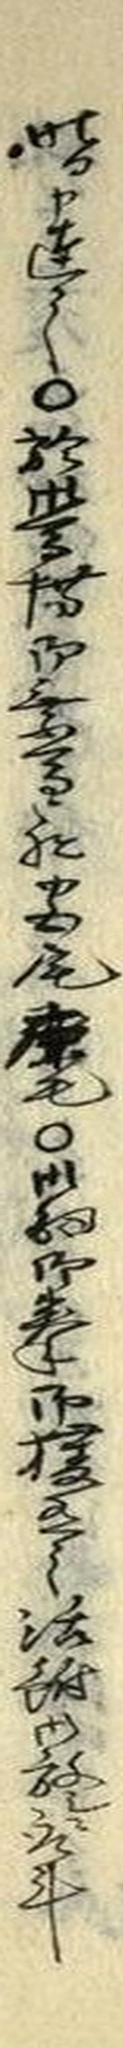昨日申達之〇於御馬場御乗馬被遊宮尾鹿毛〇御網御拳御獲有之活鮒御放シニ取計
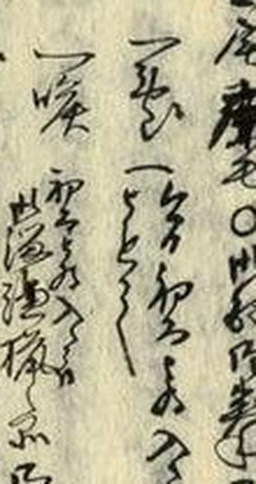被進之
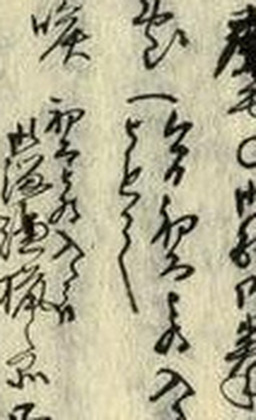被進之
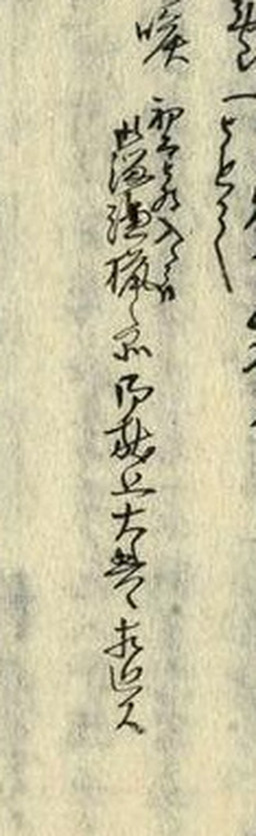御溜漁猟之品御献上大奥へ相廻ス
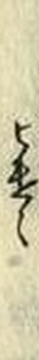被進之
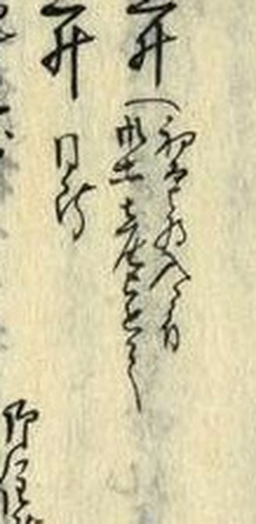御土産被進之
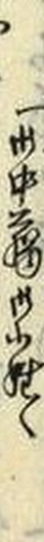御中臈御小姓へ
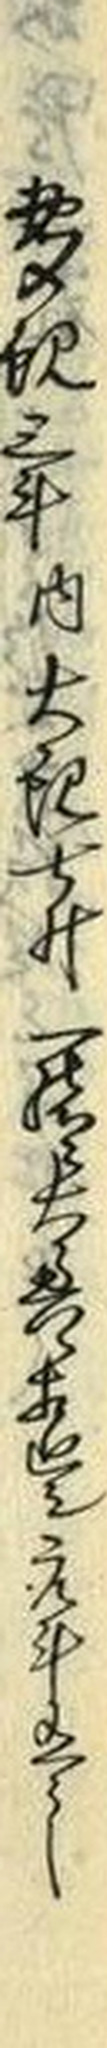惣〆蜆三斗内大蜆七升一緒ニ大奥へ相廻シ取計有之
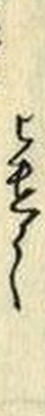被進之
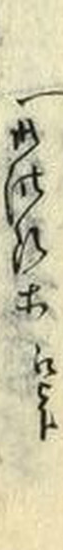御供頭等江被下
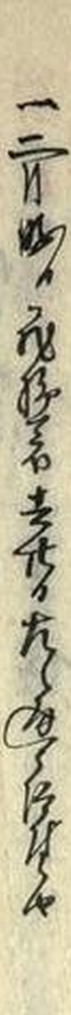一二月晦日飛脚着去廿日左之通被仰付候由
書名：少傅日録抄（斉善付側向頭取日記、在府）
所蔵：福井県文書館 Fukui Prefectural Archives
